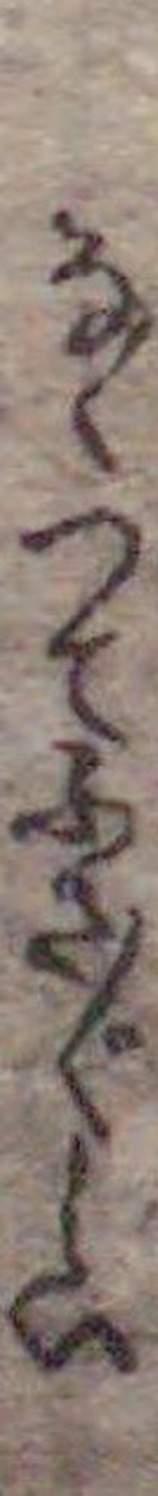なくつてふさ〴〵しい
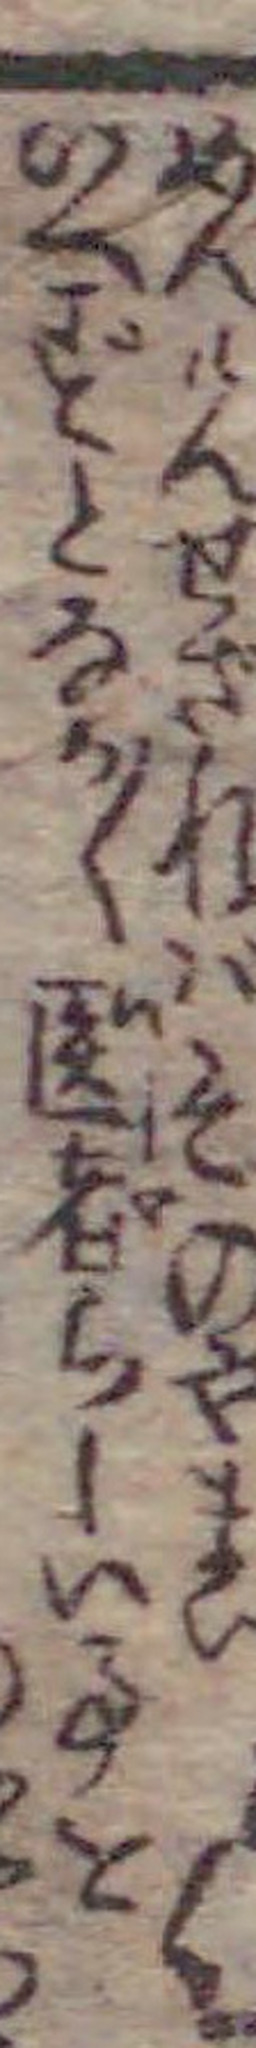いへずとなか〳〵医者らしい事を
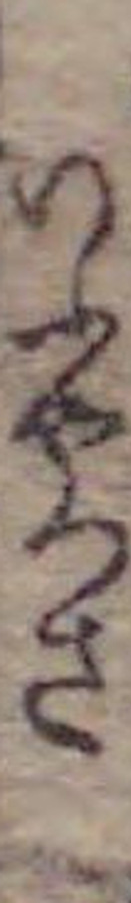いふやつさ

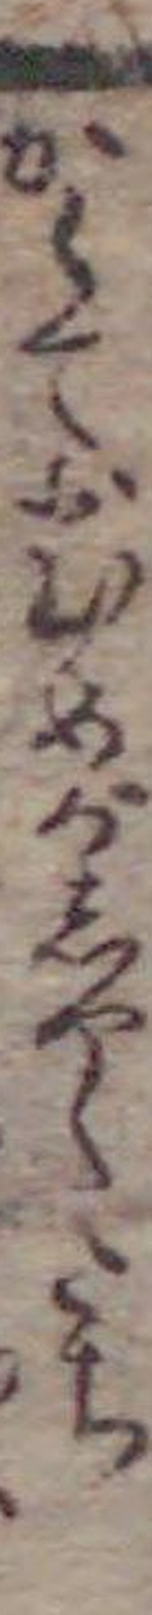かくておむめがしやくたち
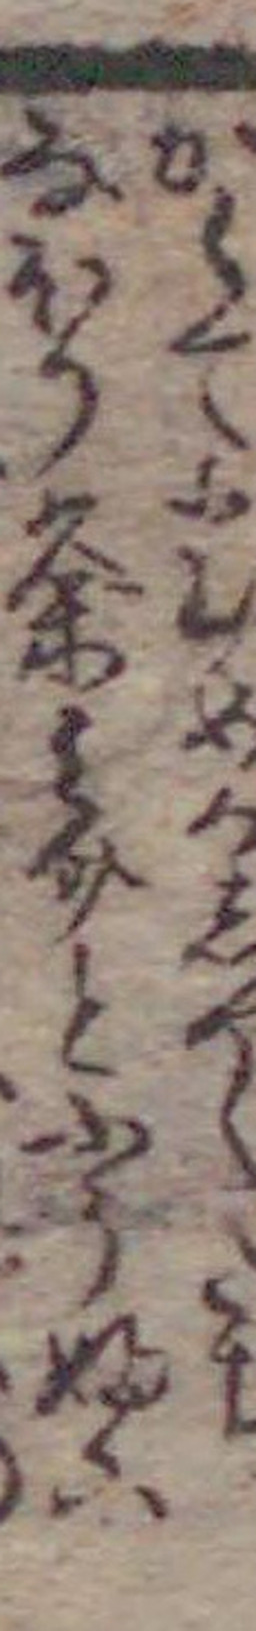なほり久米之介とふうふに
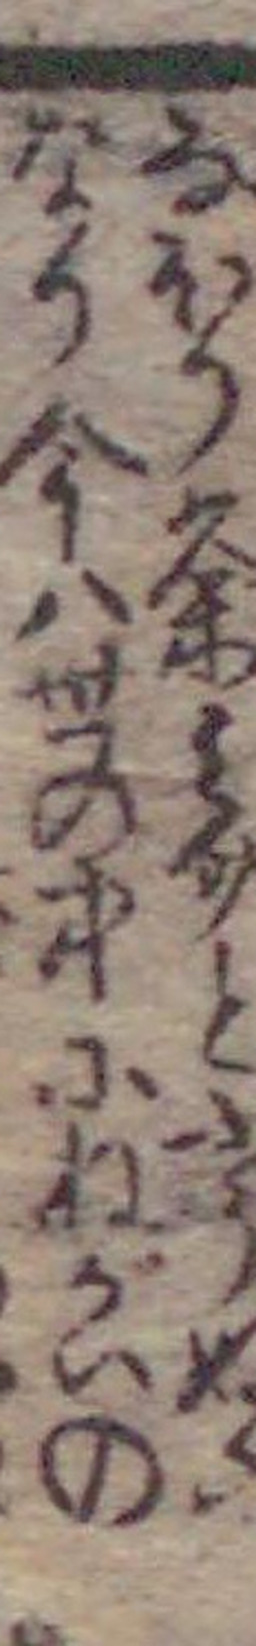なり今は世の中にねがいの
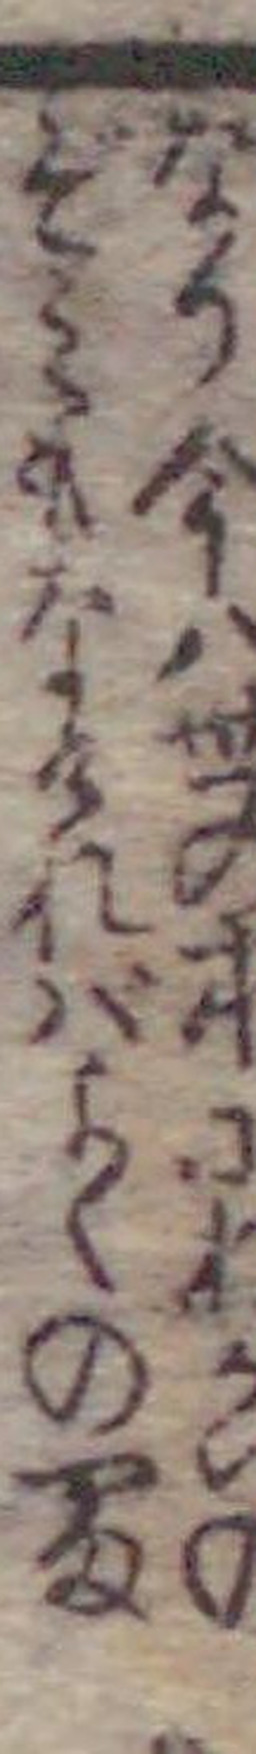ぞみもなければよくのやま
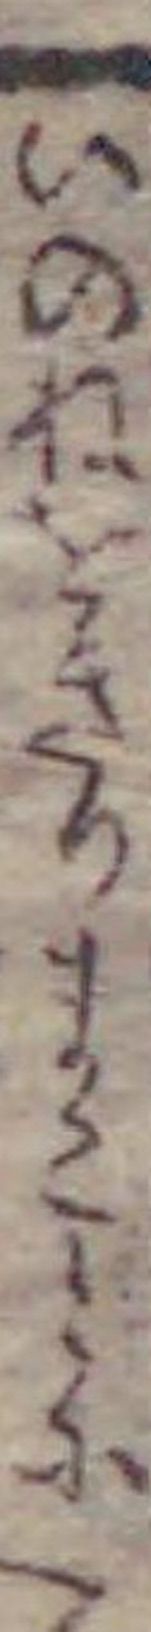いのねをきりまことに
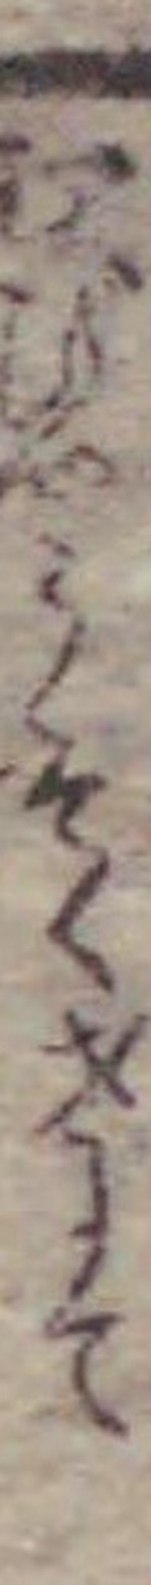むびやうそく才にて
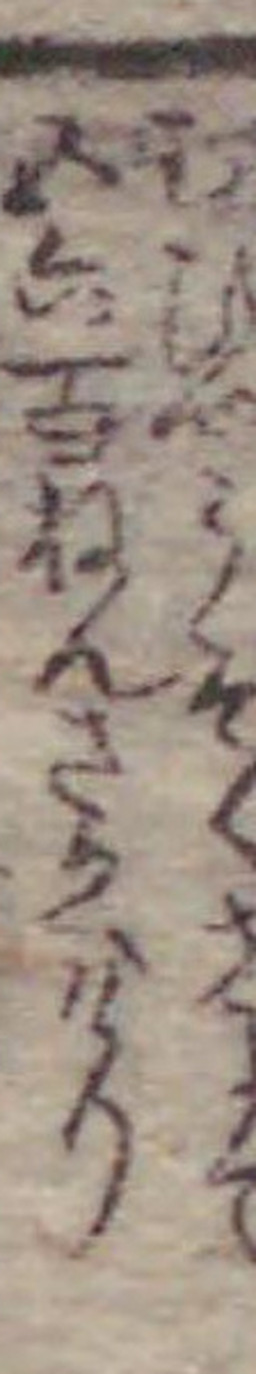五六百ねんさかへけり
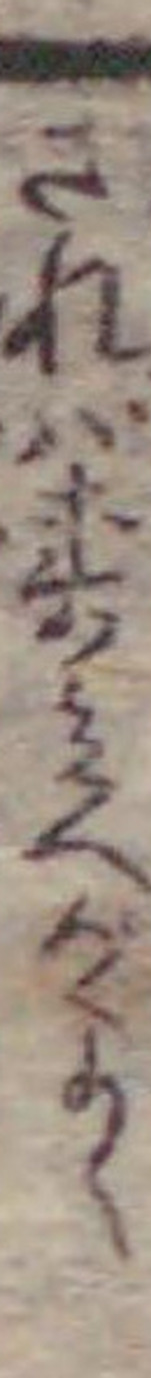されば寿兵へがよく
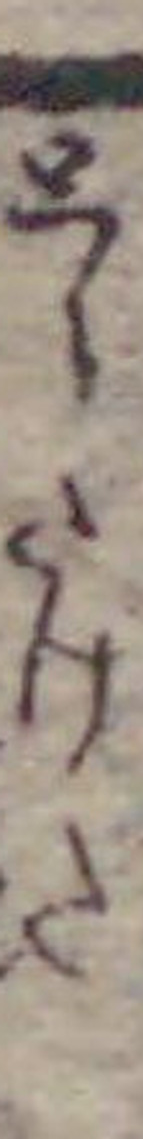としたけた
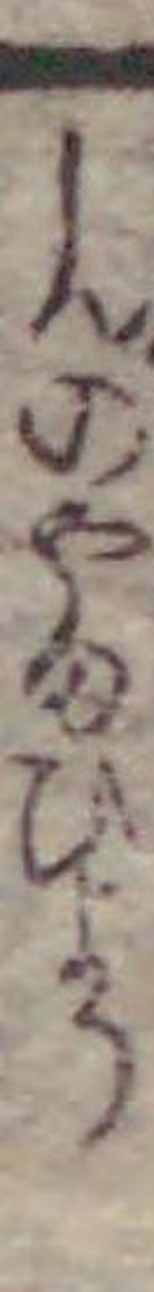しんのやまひより
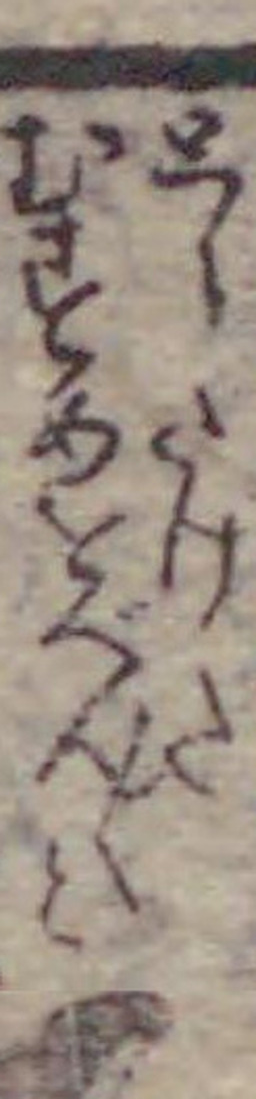むすめをべん〳〵と
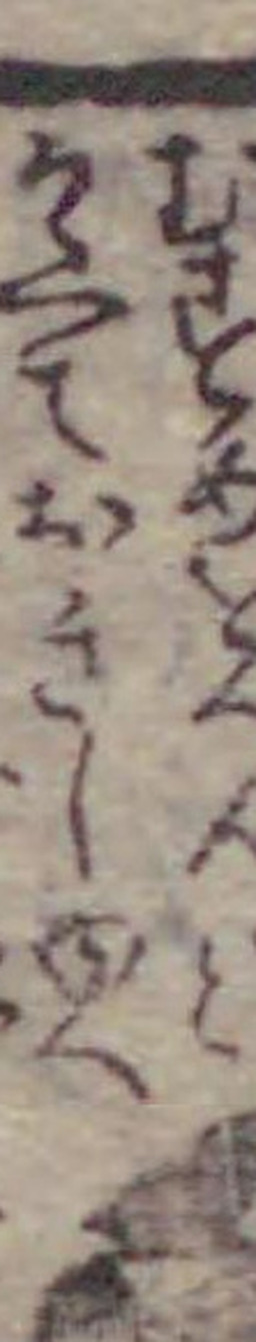かゝへておきしゆへ
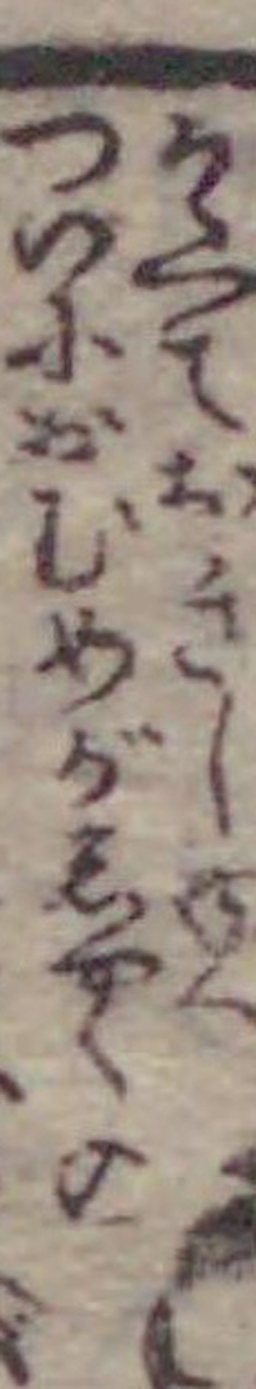ついにおむめがしやくの
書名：鼻下長生薬 : 3巻
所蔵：国立国会図書館 National Diet Library, JAPAN
